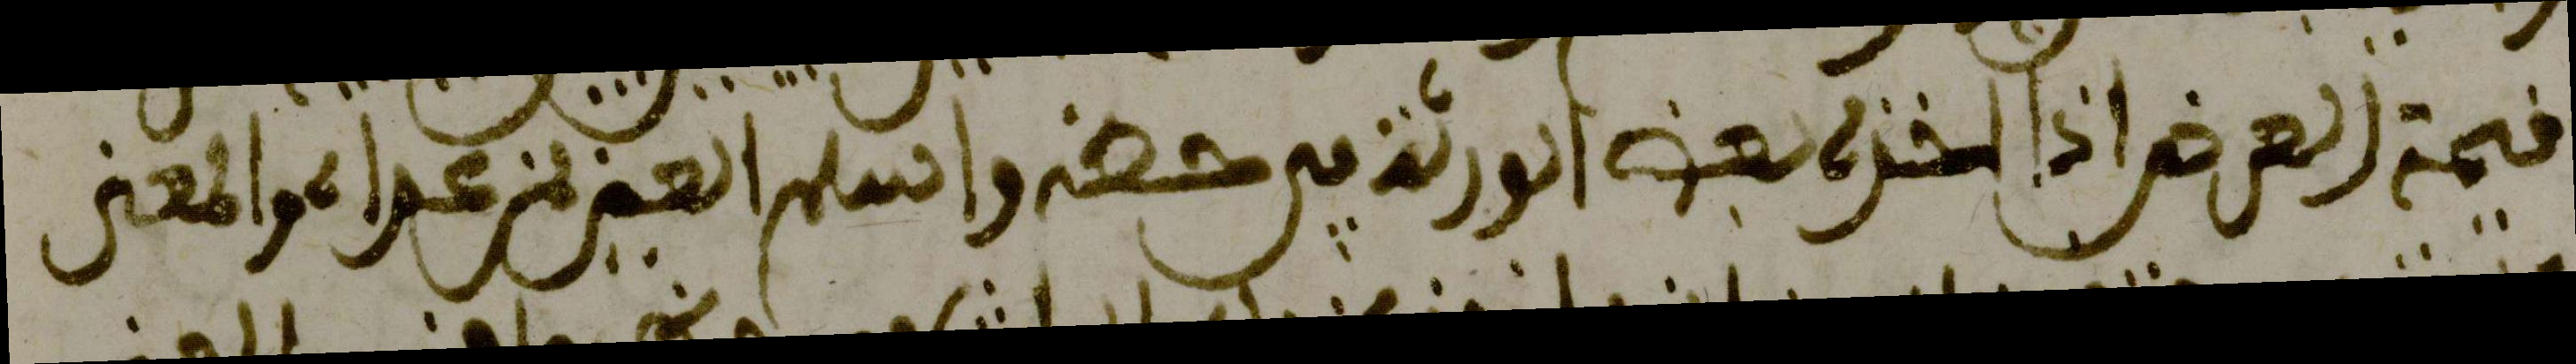قيمة العرض اذ اخذه بعض الورثة في حضه واسلم العين لمن عداه والمعنى
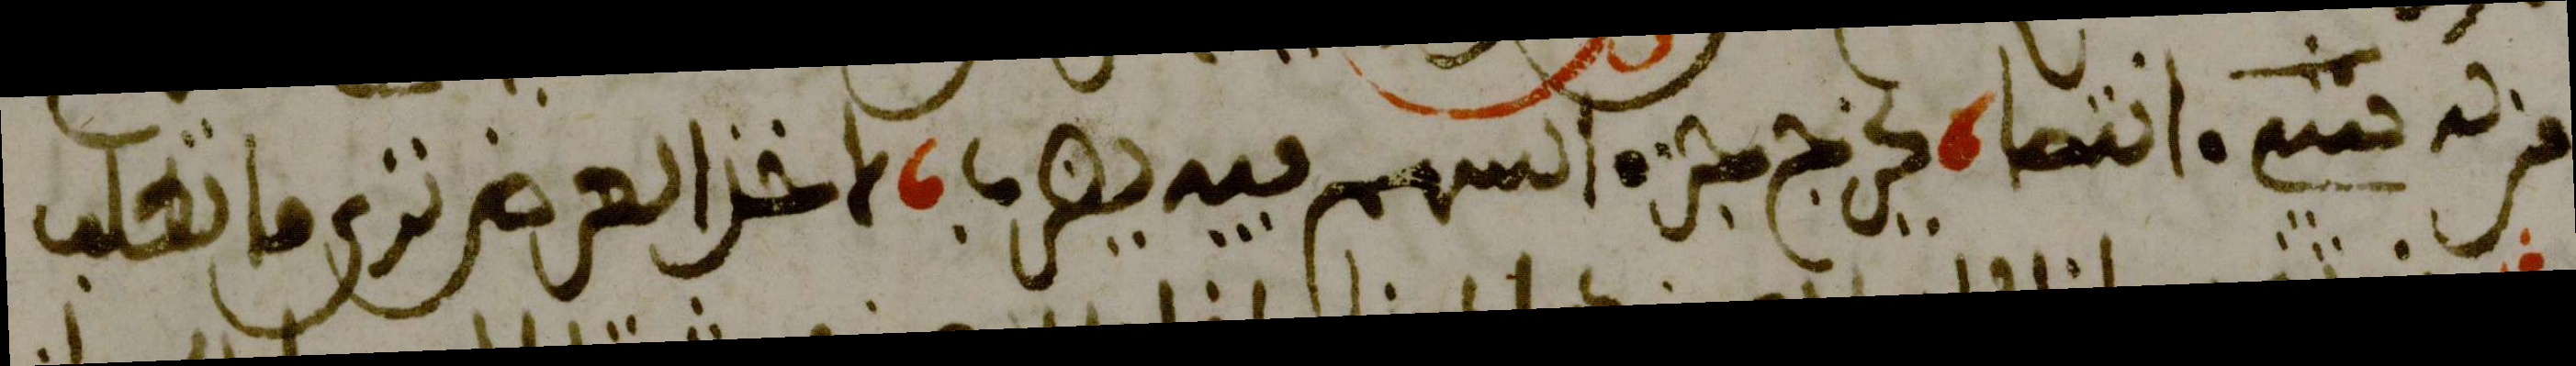من له شيء انتما يخرج جزء السهم فيه يضرب لاخذ العرض ترى ما تطلب
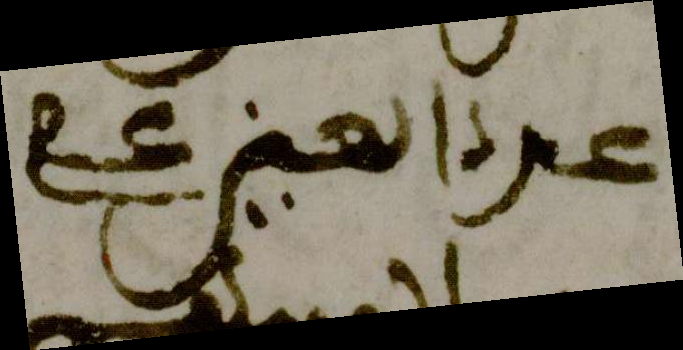عدد العين على
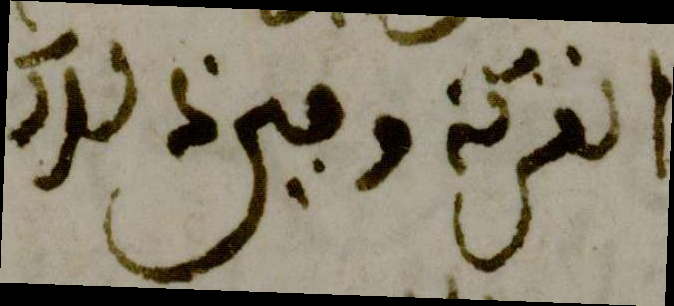التركة وفي ذلك
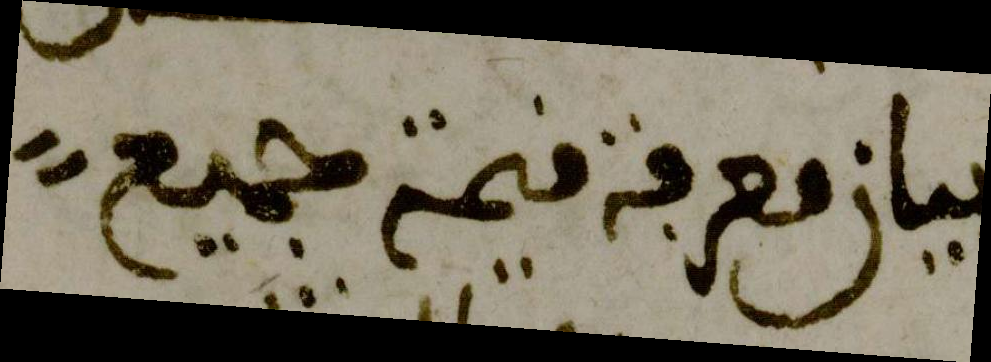بيان معرفة قيمة جميع
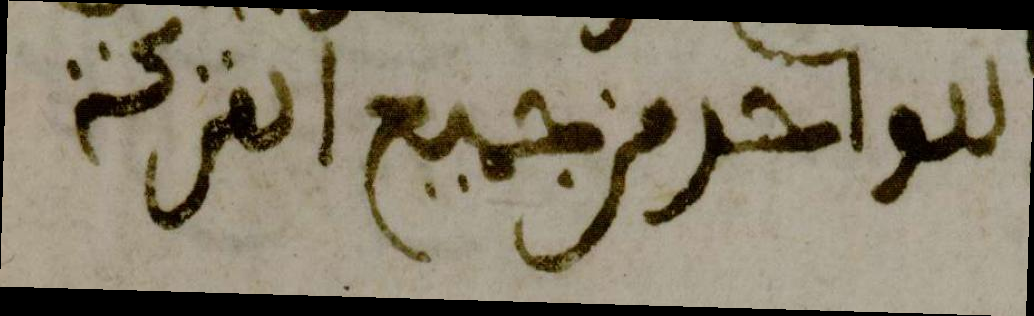للواجد من جميع التركة
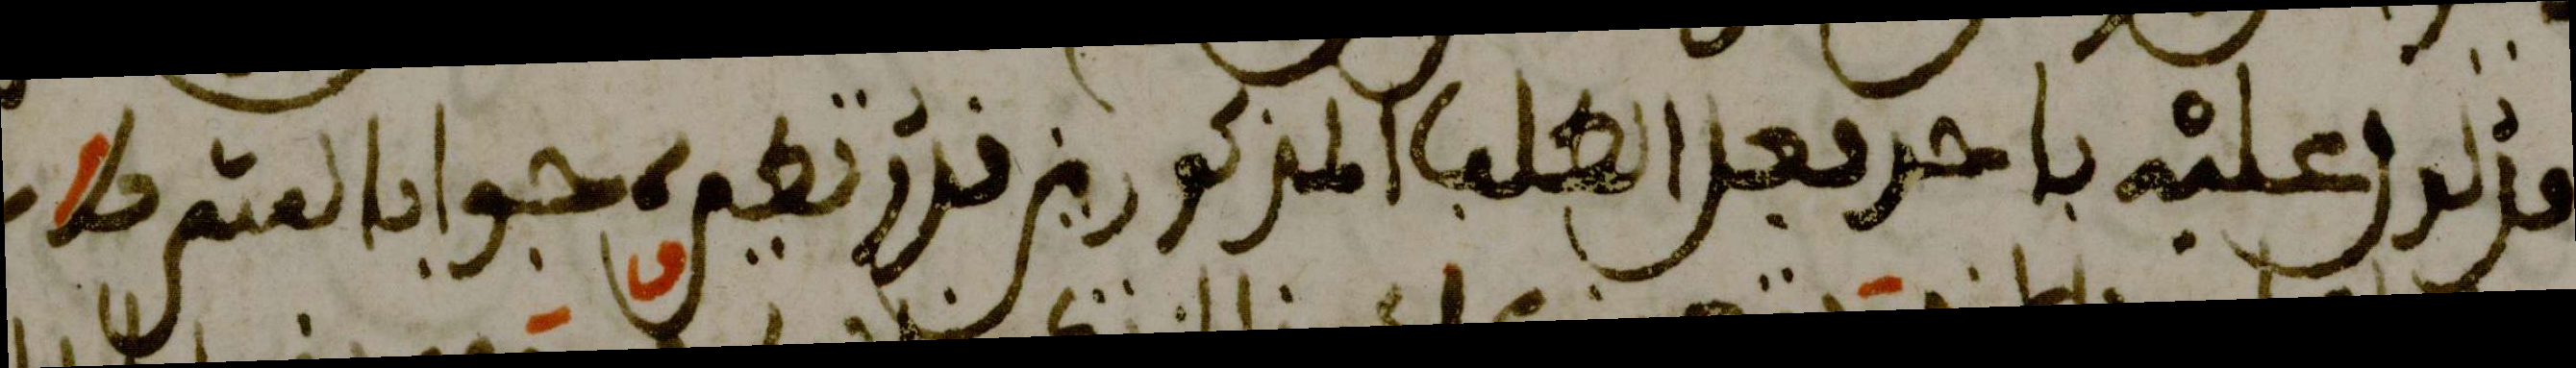مدلول عليْه باحد فعل الطلب المذكورين قدر نظيره جوا بالشرط
